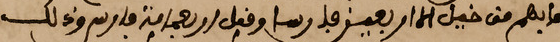ما بهم من خيل الا اربعين فارسا وقيل اربعماية فارس وذلك
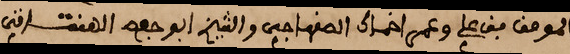المومن بن علي وعمر اضماك الصنهاجي والشيخ ابو حفص الهنتاتي
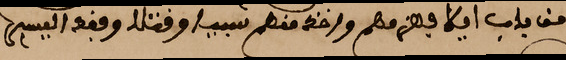من باب ايلا فهزمهم واخذ منهم سبيا وقتلا وفقد اليسير
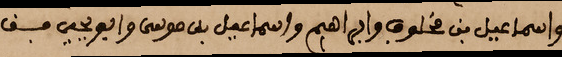واسماعيل بن مخلوف وابراهيم واسماعيل بن موسى وابو يحيى بن
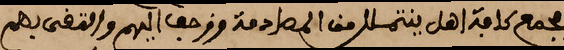فجمع كافة اهل ينتملل من المصادمة وزحف اليهم والتقى بهم
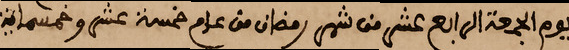يوم الجمعة الرابع عشر من شهر رمضان من عام خمسة عشر وخمسماية
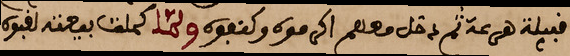قبيلة هرعة ثم دخل معهم اكرموه وكنفوه ولما كملت بيعته لقبوه
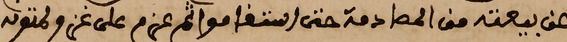هعن بيعته من المصادمة حتى استقاموا ثم عزم على غزو لمتونة
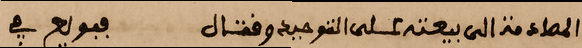المصادمة الى بيعته على التوحيد وقتال فبويع في
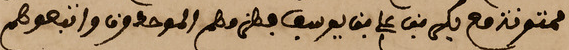لمتونة مع بكر بن علي بن يوسف فهزمهم الموحدون واتبعوهم
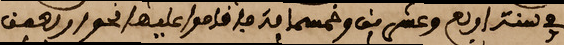في سنة اربع وعشرين وخمسماية فاقاموا عليها نحو اربعين
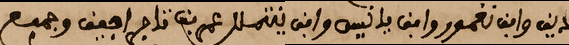دين وابن نغمور وابن يانيس وابن ينتملل عمر بن تاجراجين وجميع
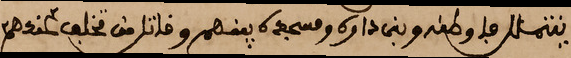ينتملل فاوطنه وبنى داره ومسجده بينهم وقاتل من تخلف عنهم
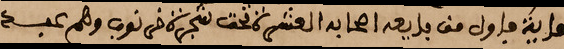ماية فاول من بايعه اصحابه العشرة تحت شجرة خرنوب وهم عبد
